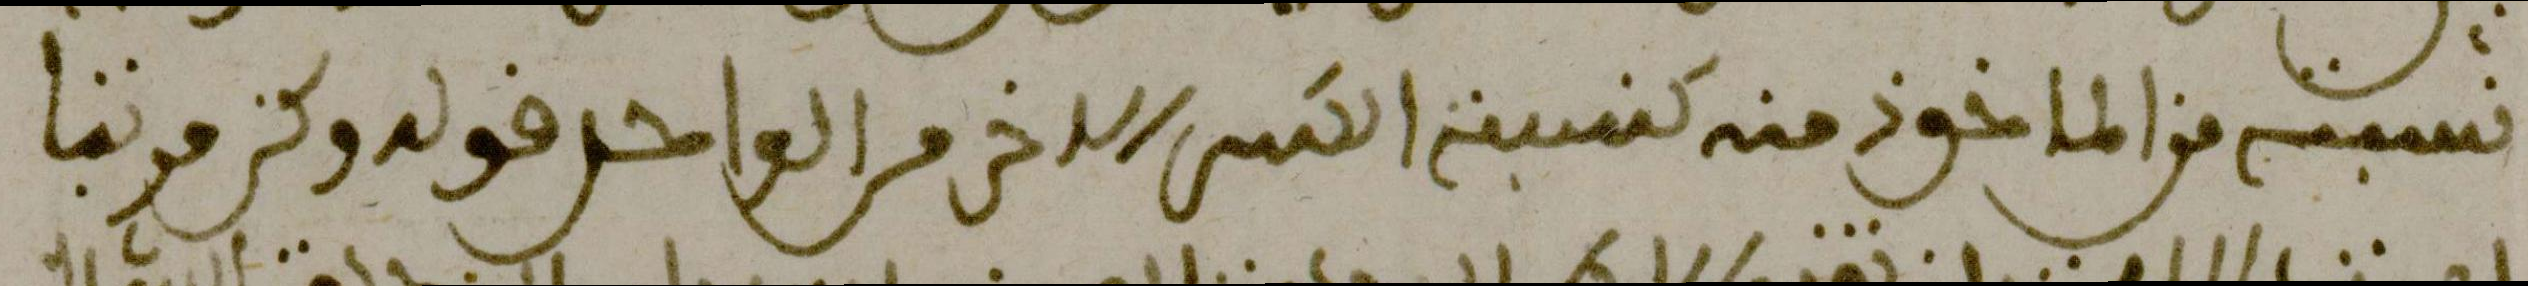نسبته من الماخوذ منه كنسبته الكسر الاخر من الواحد قوله و كن مرتبا
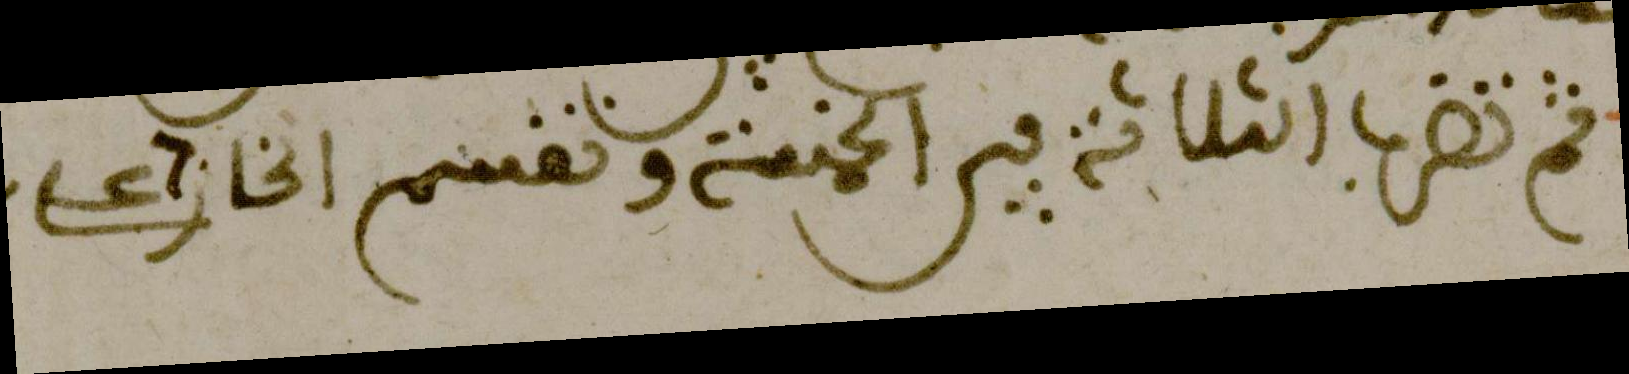ثم تضرب الثلاثةفي الخمسة و تقسم الخارج على
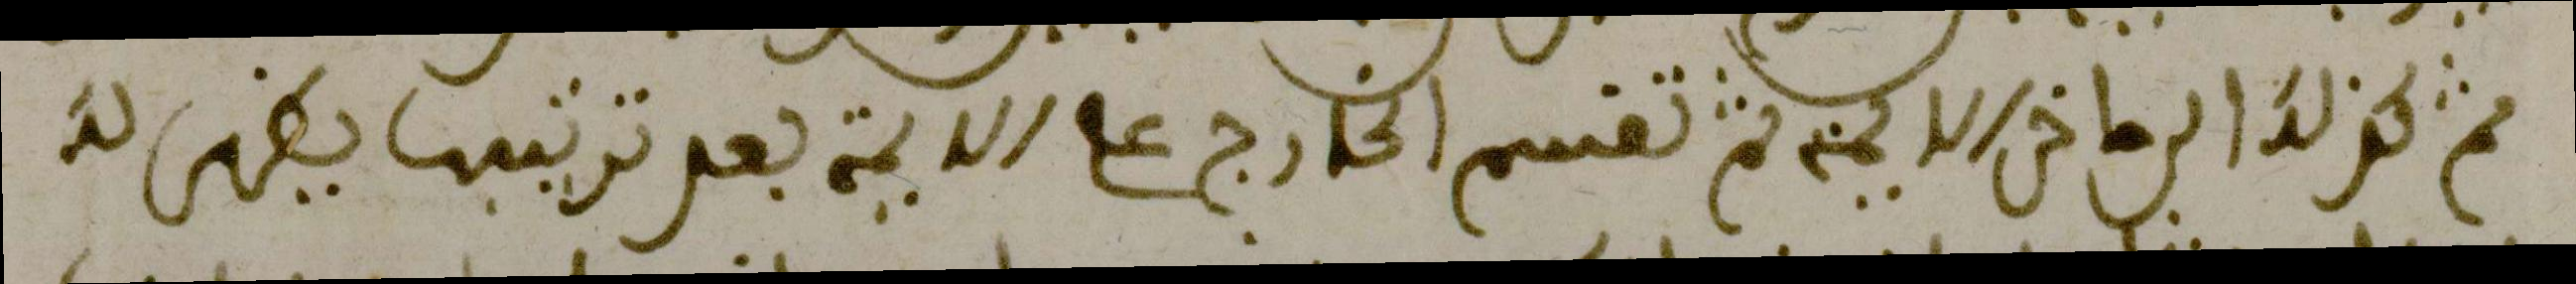ثم كذلك الى ءاخر الايمة ثم تقسم الخارج على الايمة بعد ترتيبها يظهر لك
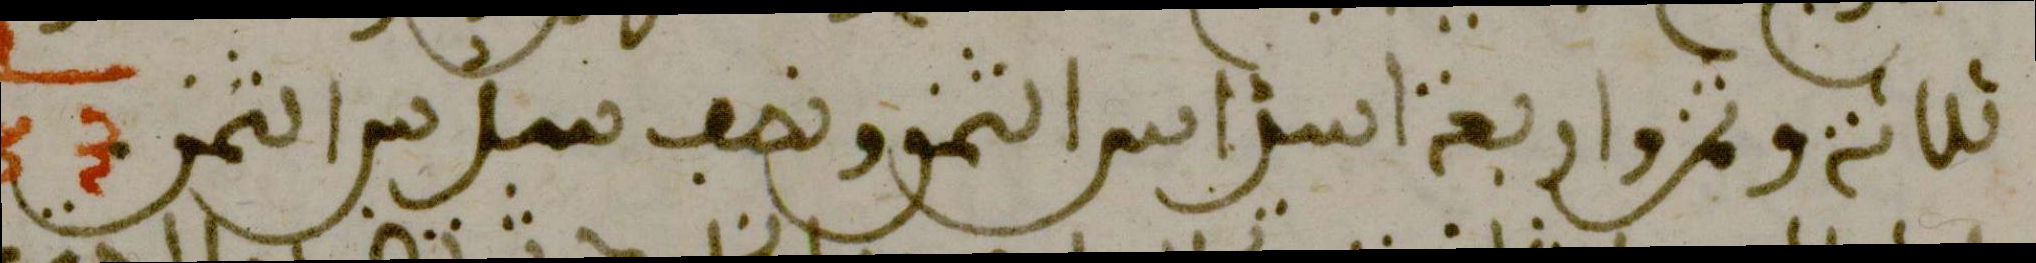ثلاثة و ثمن و اربعة اسداس الثمن و نصف سدس الثمن
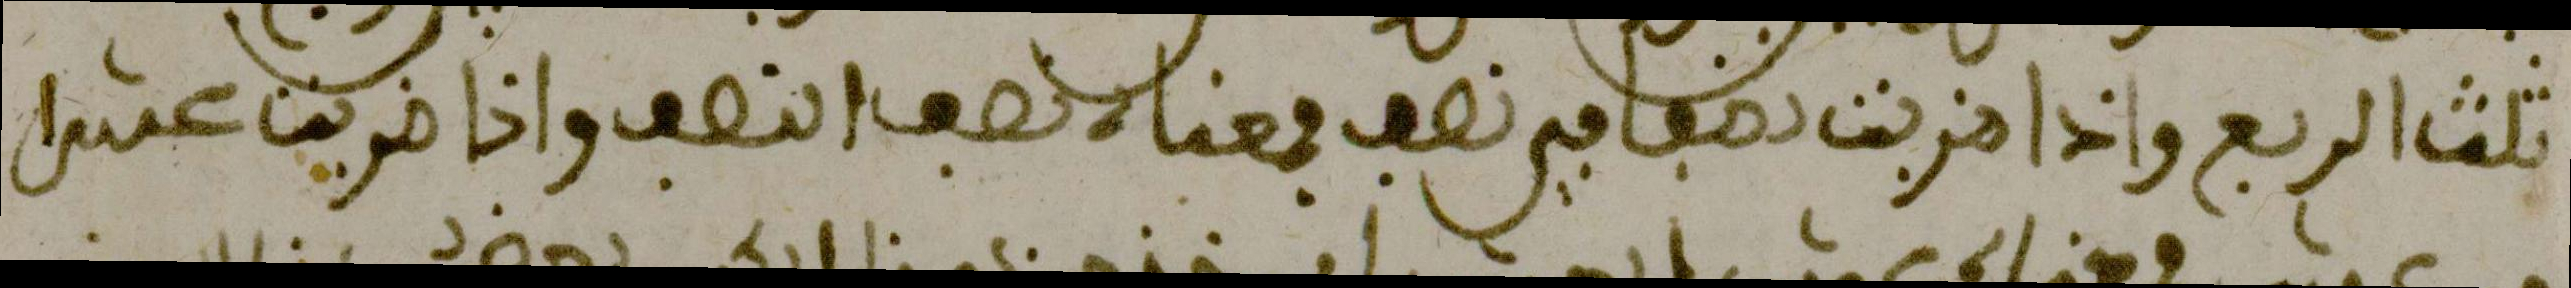ثلث الربع و اذا ضربت نصفا في نصف فمعناه نصف النصف و اذا ضربت عشرا
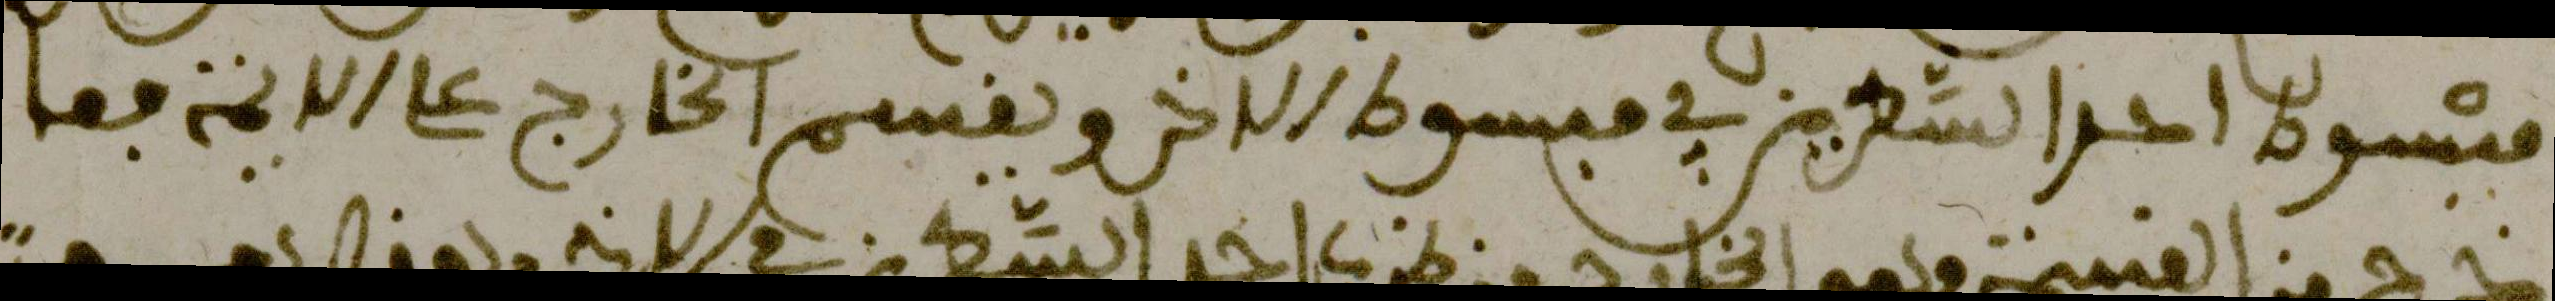مبسوط احد السّطرين في مبسوط الاخر و يقسم الخارج على الايمة فما
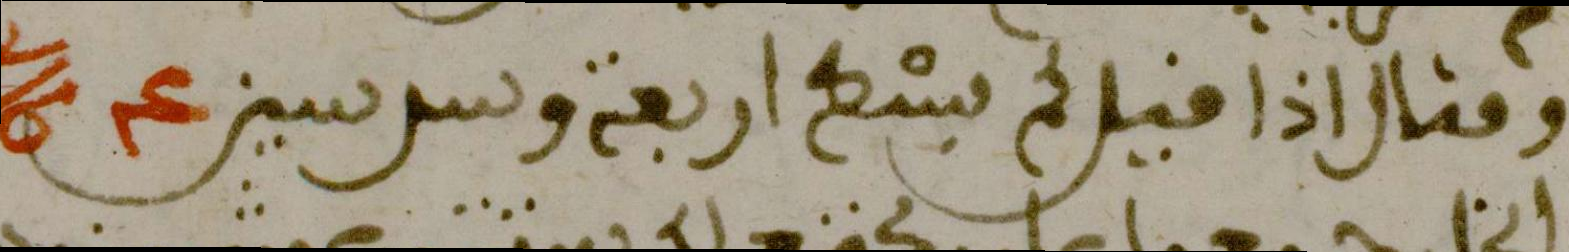و مثال اذا قيل كم بسط اربعة و سدسين
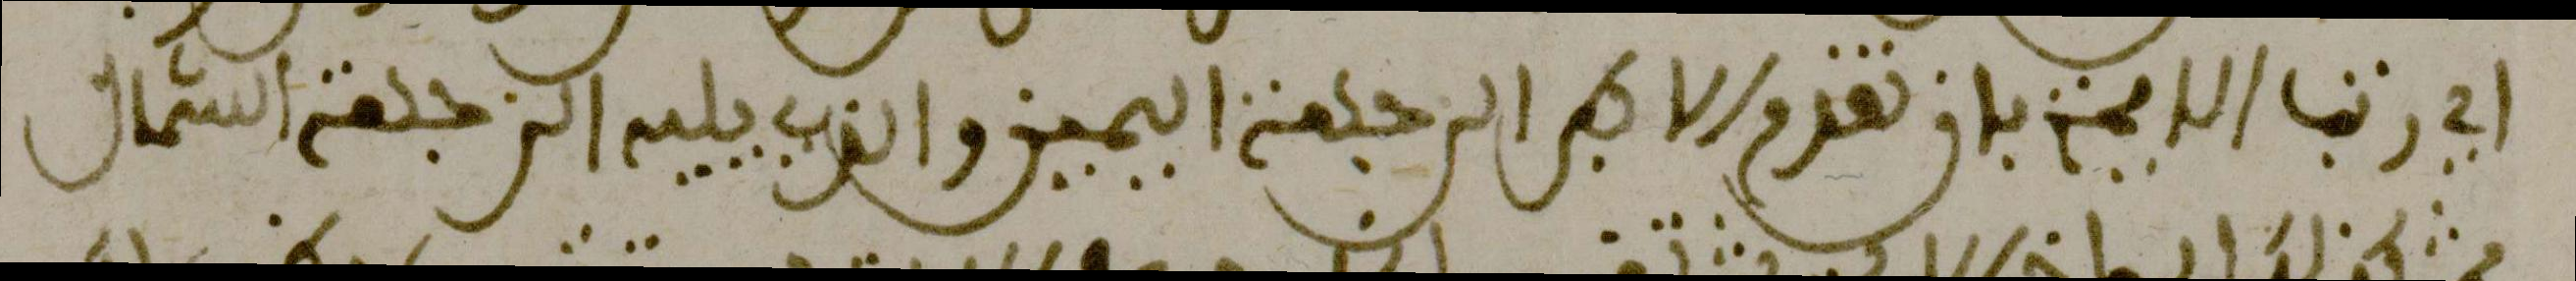اي رتب الايمة بان تقدم الاكبر الى جهة اليمين و الذي يليه الى جهة الشمال
